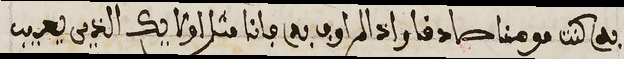به كنت مومنا صادقا و اذا لم اوف به فانا مثل اولايك الذين يعيب
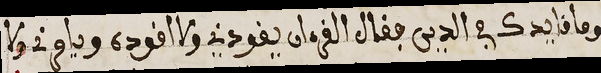وما قايدك في الدين فقال القرىء ان يقودني ولا اقوده ويامرني ولا
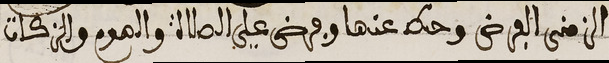الزمني الفرض و حط عنها و فرض علي الصلاة و الصوم و الزكات
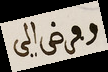و فرض الي
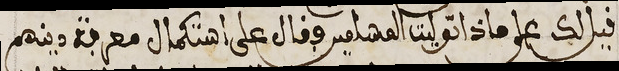قيل لك على ماذا توليت المسلمين فقال على استكمال معرفة دينهم
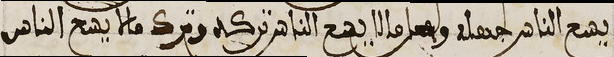يسع الناس جهله وفعل ما لا يسع الناس تركه وترك ما لا يسع الناس
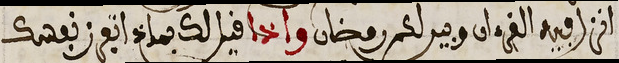انزل فيه القرءان و بين لكم رمضان و اذا قيل لك بماذا تفرز نفسك
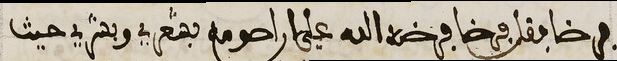برضا فقل فرضا فرضه الله علي ان اصومه بشعري و بشري حيث
